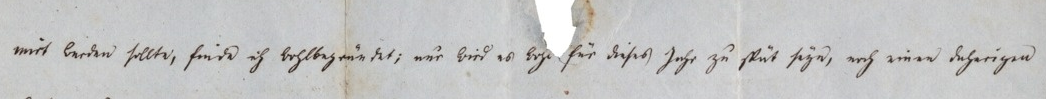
mirt werden sollte, finde ich wohlbegründet; nur wird es wohl für dieses Jahr zu spät seyn, noch einen daherigen
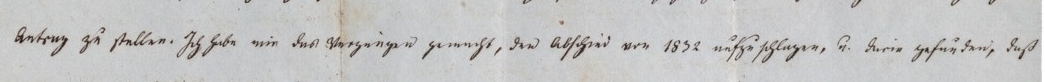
Antrag zu stellen. Ich habe mir das Vergnügen gemacht, den Abschied von 1832 aufzuschlagen, u. darin gefunden, daß
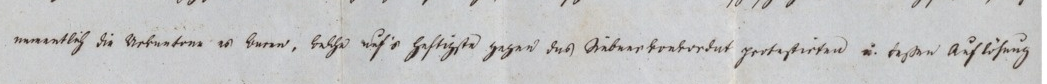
namentlich die Urkantone es waren, welche auf's heftigste gegen das Siebnerkonkordat protestirten u. dessen Auflösung
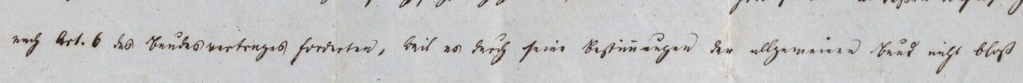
nach Art. 6 des Bundesvertrages forderten, weil es durch seine Bestimmungen den allgemeinen Bund nicht bloß
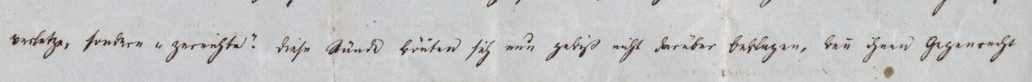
verletze, sondern «zernichte». Diese Stände könnten sich nun gewiß nicht darüber beklagen, wenn ihnen Gegenrecht
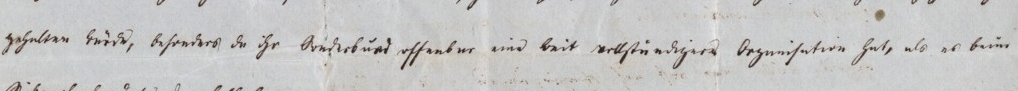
gehalten würde, besonders da ihr Sonderbund offenbar eine weit vollständigere Organisation hat, als es beim
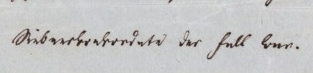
Siebnerkonkordate der Fall war.
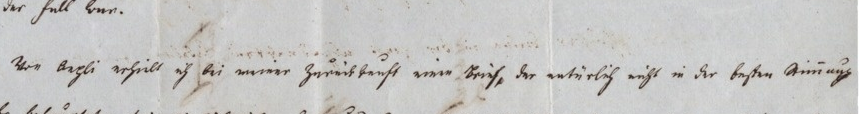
VonAepli erhielt ich bei meiner Zurückkunft einen Brief, der natürlich nicht in der besten Stimmung
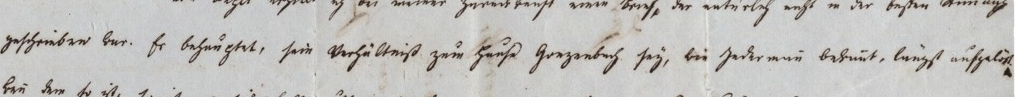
geschrieben war. Er behauptet, sein Verhältniß zum Hause Gonzenbach sey, wie Jedermann bekannt, längst aufgelöst.
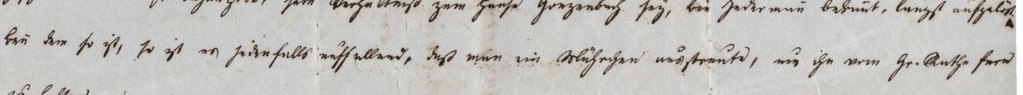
Wenn dem so ist, so ist es jedenfalls auffallend, daß man ein Mährchen ausstreute, um ihn vom Gr. Rathe fern
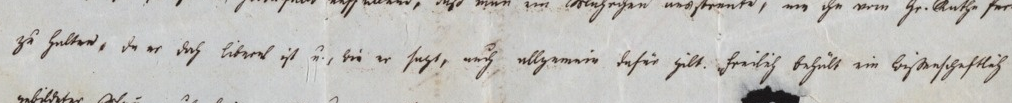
zu halten, da er doch liberal ist u., wie er sagt, auch allgemein dafür gilt. Freilich behält ein wissenschaftlich
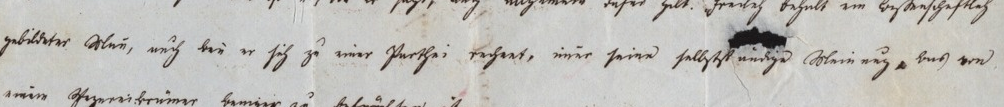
gebildeter Mann, auch wenn er sich zu einer Parthei rechnet, immer seine selbstständige Meinung, was von
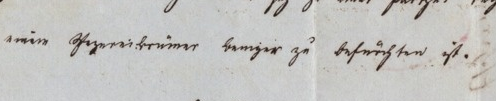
einem Spezereikrämer weniger zu befürchten ist.
